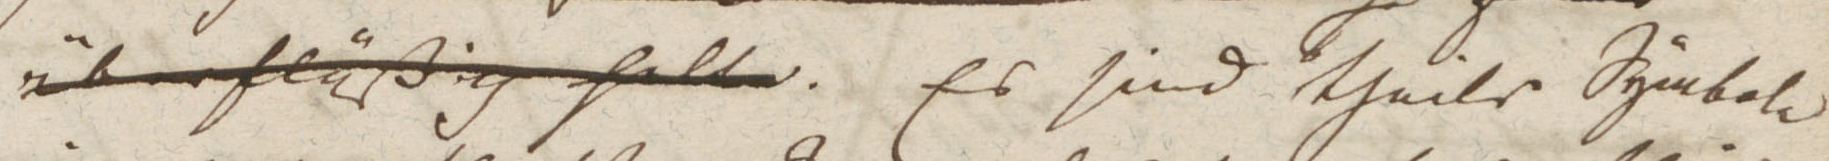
überflüssig halte. Es sind theils Symbole
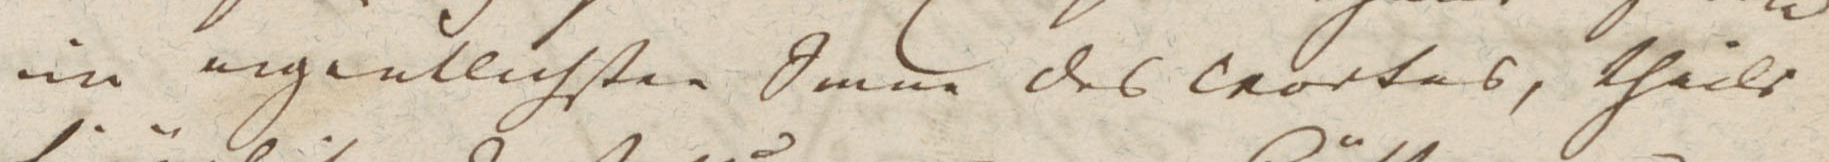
im eigentlichsten Sinne des Wortes, theils
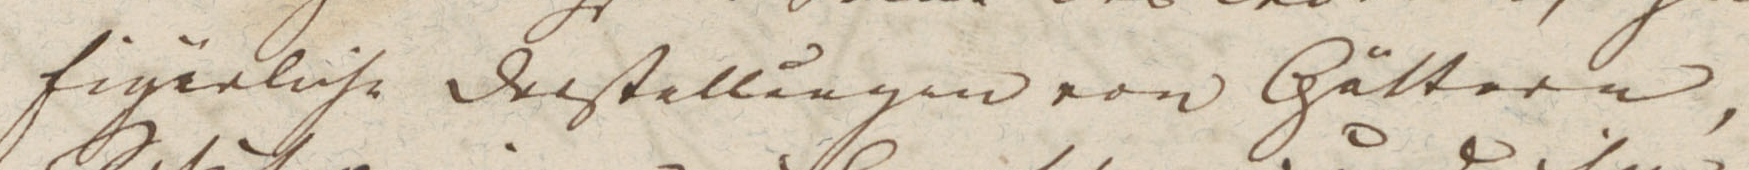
figürliche Darstellungen von Göttern,
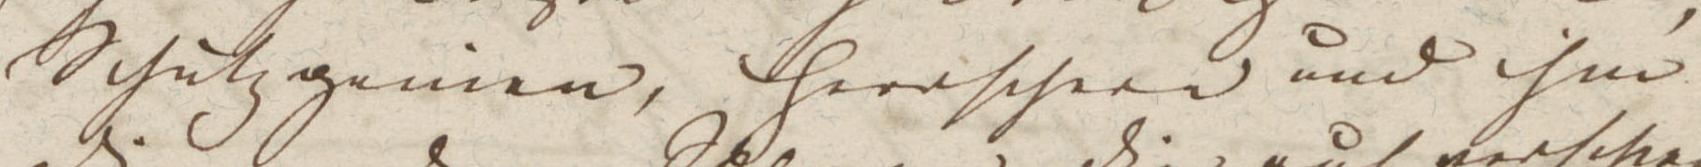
Schutzgenien, Herrschern und ihm
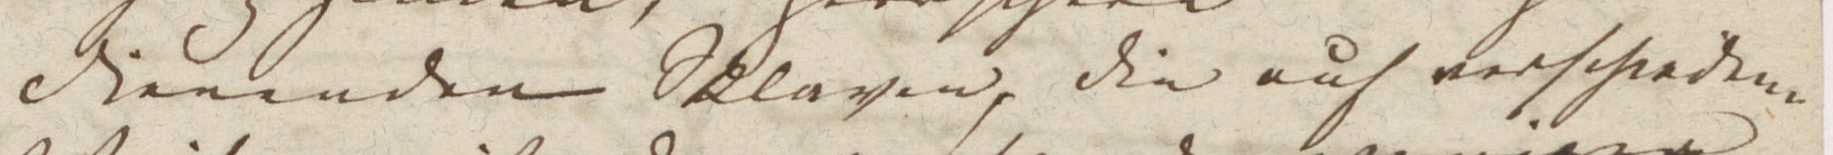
dienenden Sklaven, die auf verschiedene
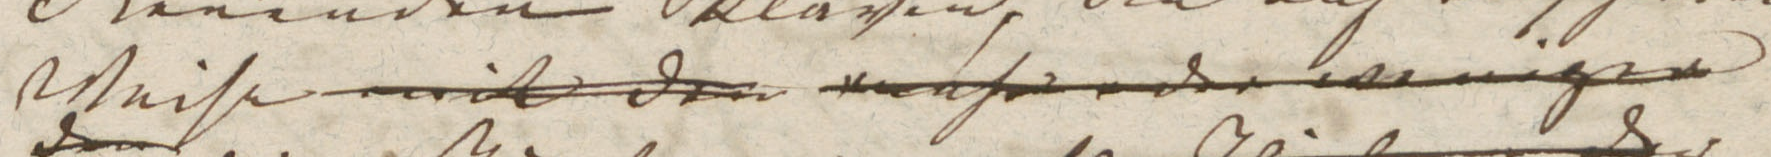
Weise mit den reiche oder weniger
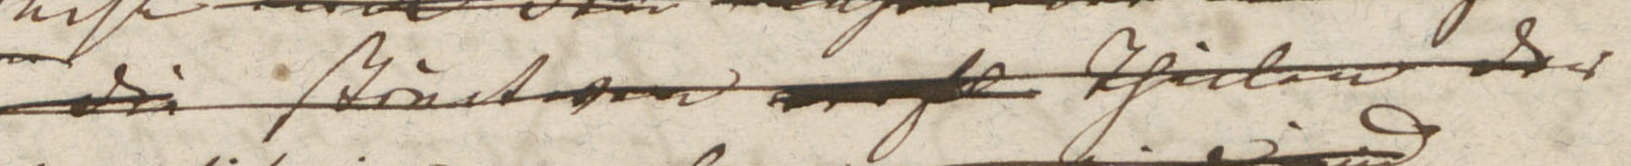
in die den structiven hl Theilen der
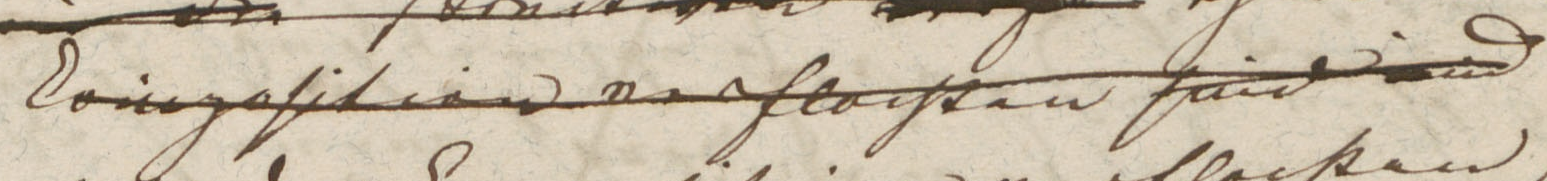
Composition verflochten sind und
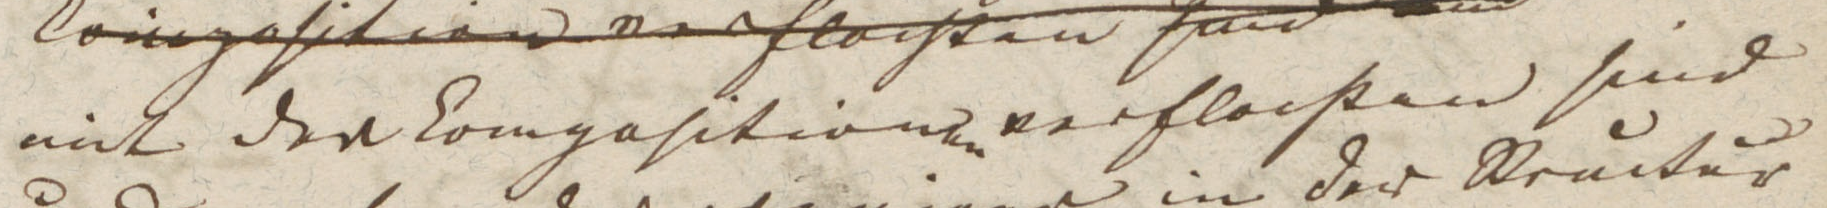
mit der Compositionen verflochten sind
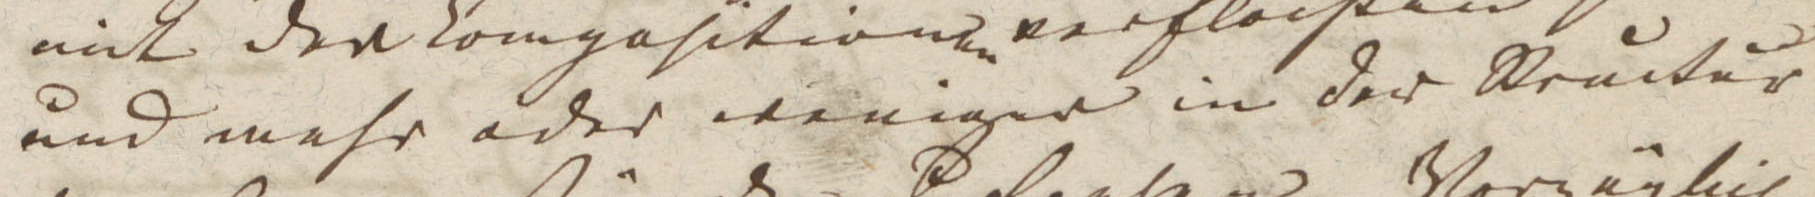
und mehr oder weniger in der Structur
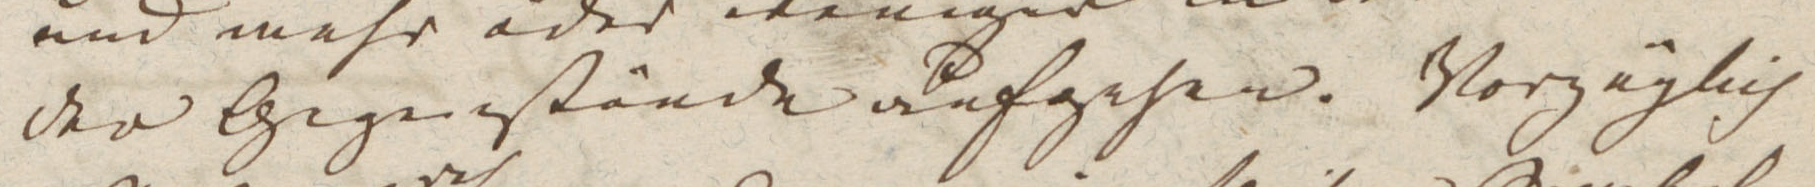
der Gegenstände aufgehen. Vorzüglich
